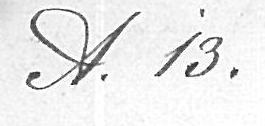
A. 13.
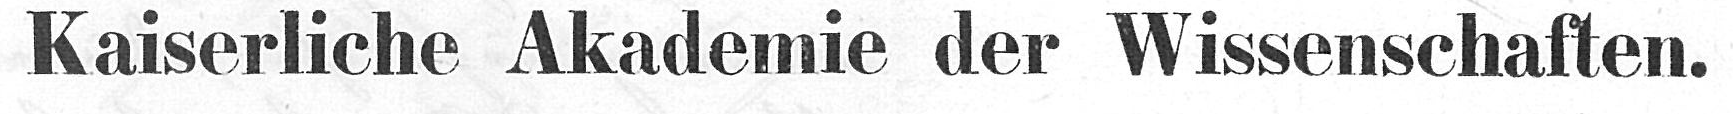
Kaiserliche Akademie der Wissenschaften.
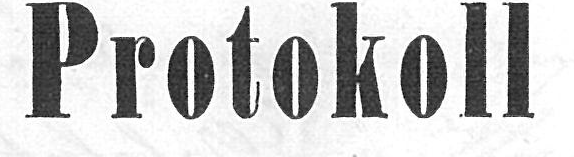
Protokoll
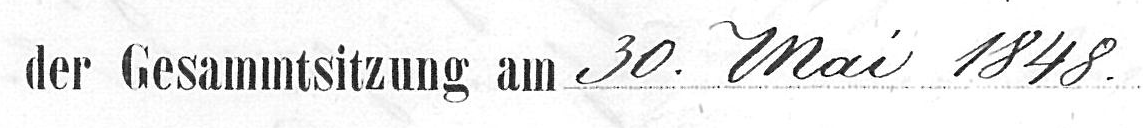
der Gesammtsitzung am 30. Mai 1848
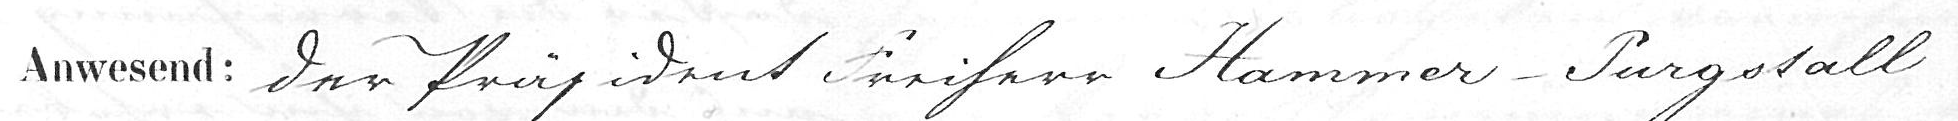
Anwesend: der Präsident Freiherr Hammer-Purgstall
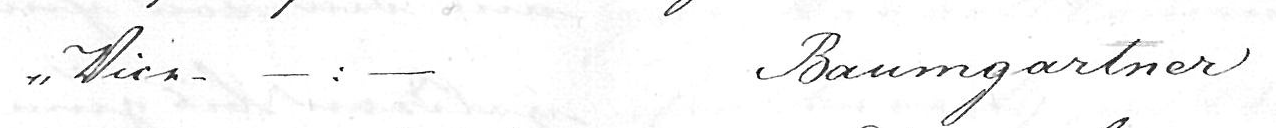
" Vice- " Baumgartner
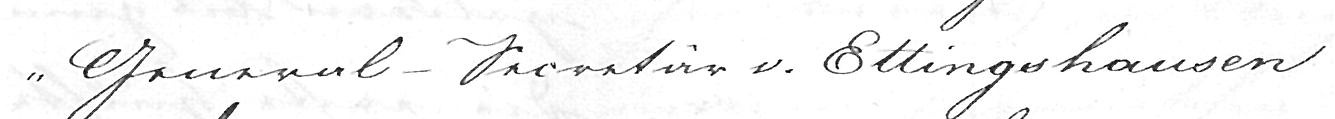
" General-Secretär v. Ettingshausen
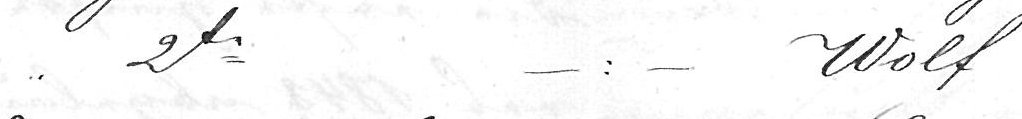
" 2te " Wolf
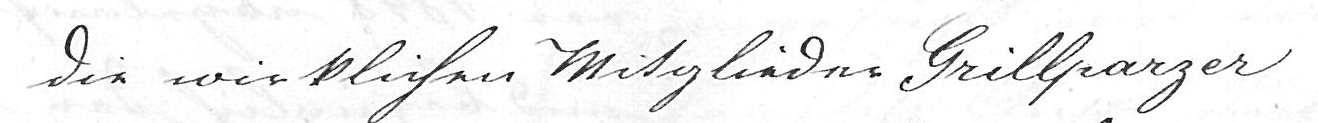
Die wirklichen Mitglieder Grillparzer
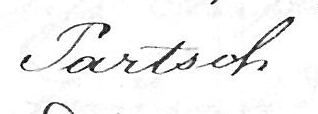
Partsch
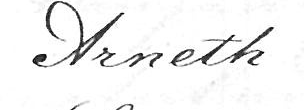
Arneth
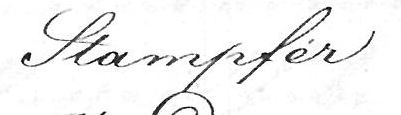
Stampfer
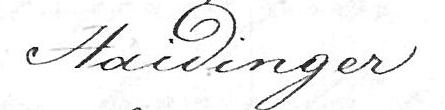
Haidinger
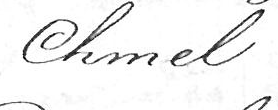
Chmel
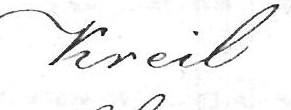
Kreil
